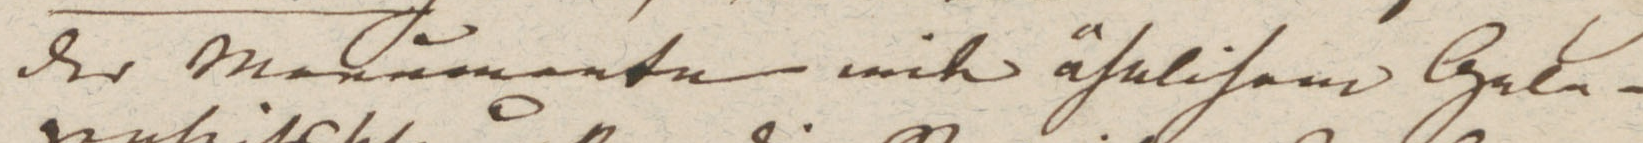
der Monumente mit ähnlichem Gele-
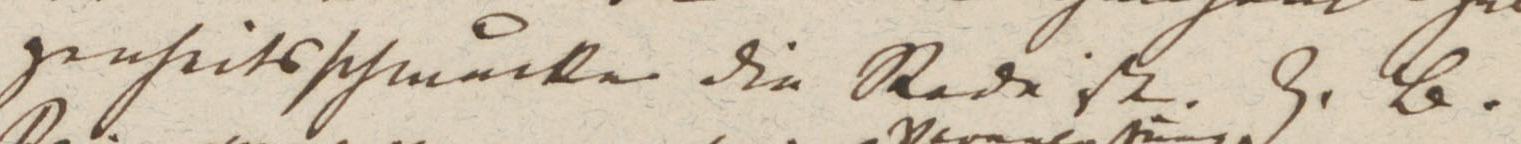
genheitsschmucke die Rede ist. Z. B.
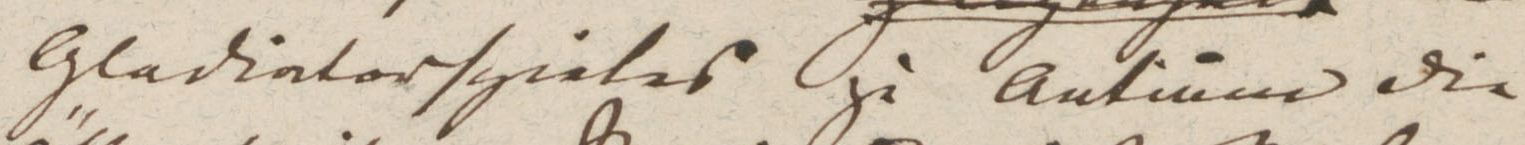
Gladiatorspieles zu Antium die
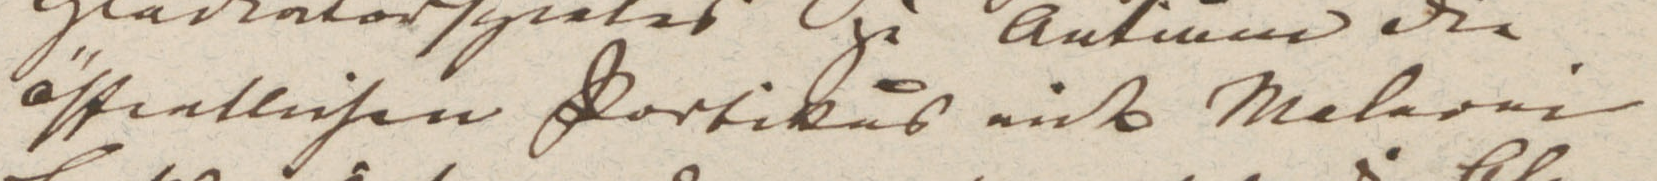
öffentichen Porikus mit Malerei
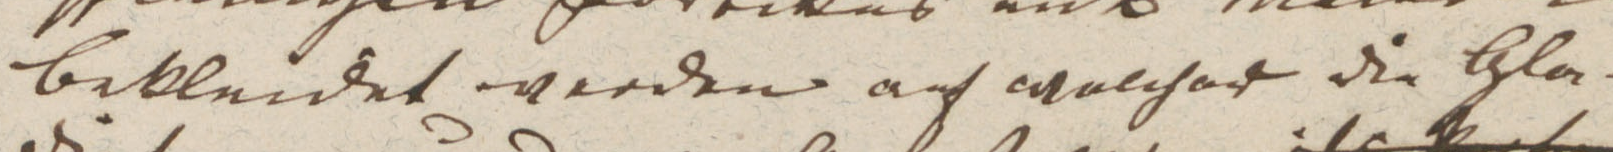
bekleidet werden auf welcher die Gla-
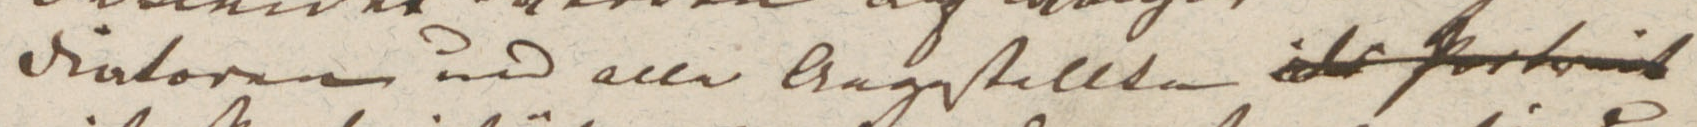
diatoren und alle Angestellte des Portrait
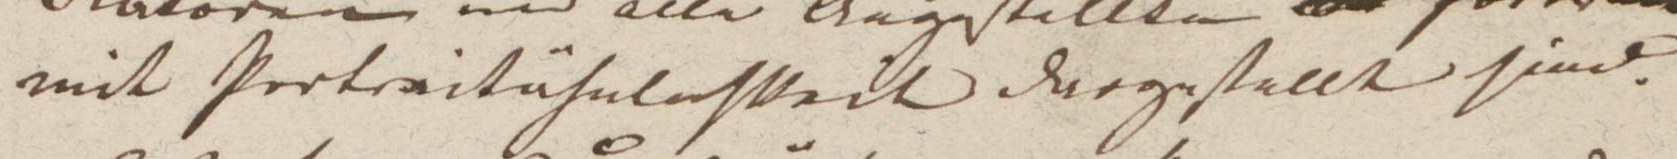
mit Portraitähnlichkeit dargestellt sind.
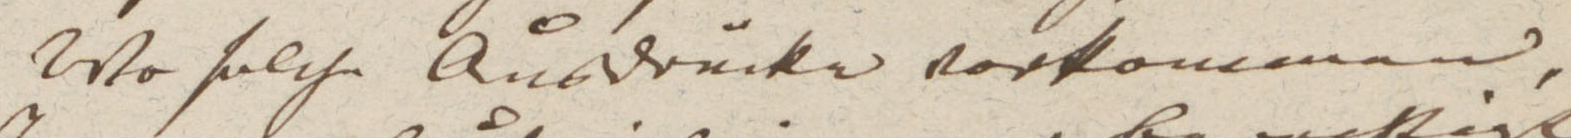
Wo solche Ausdrücke vorkommen,
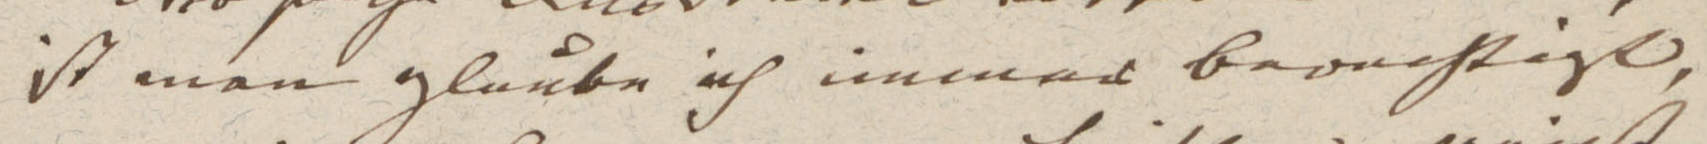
ist man glaube ich immer berechtigt,
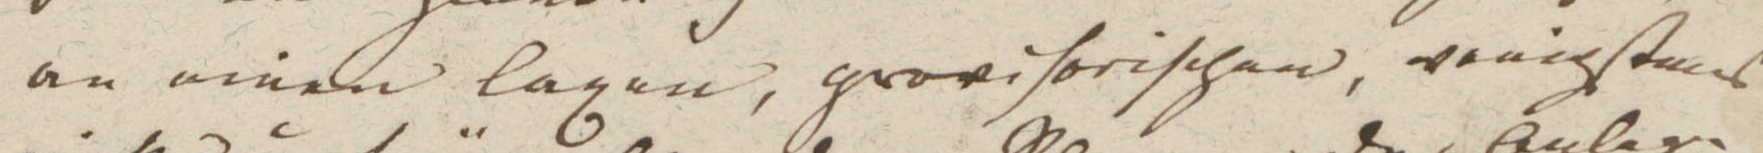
an einen laxen, provisorischen, wenigstens
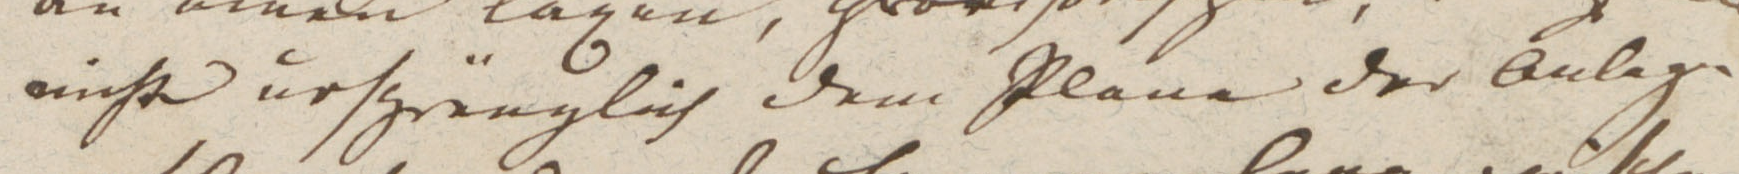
nicht ursprünglich dem Plane der Anlage
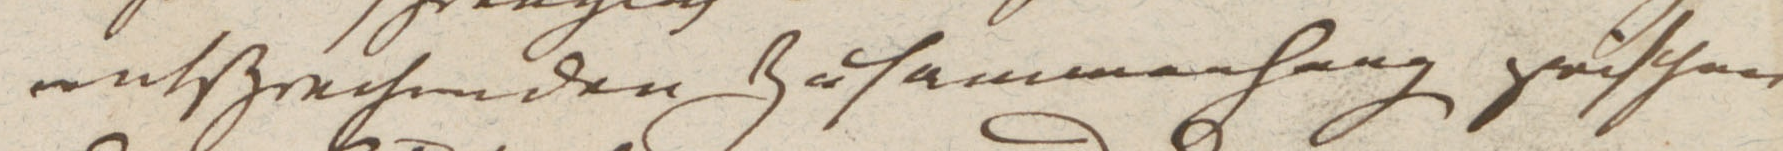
entsprechenden Zusammenhang zwischen
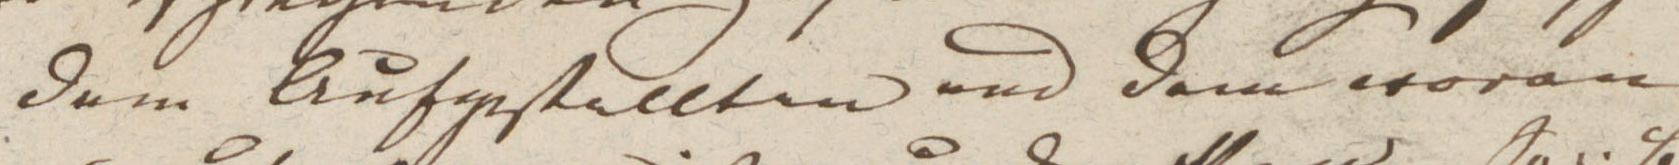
dem Aufgestellten und dem woran
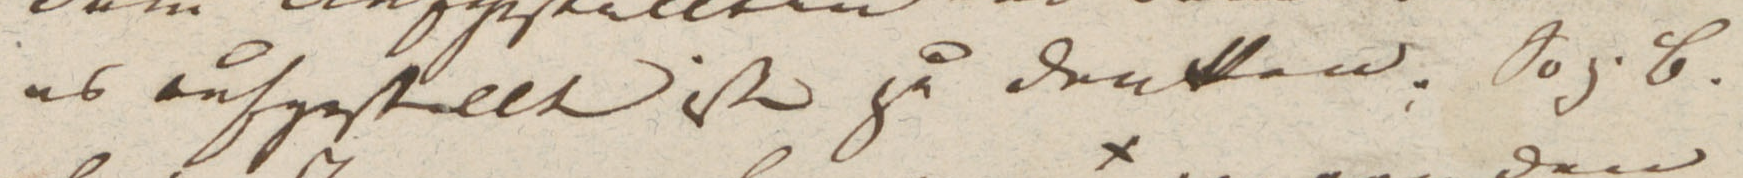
es aufgestellt ist zu denken. So z. B.
